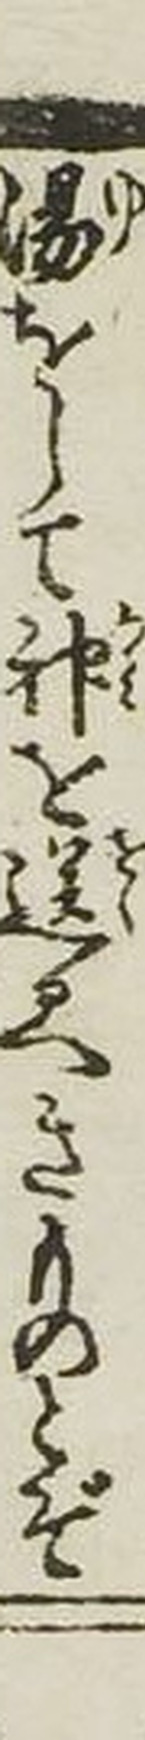湯をして神を送るへきものとぞ
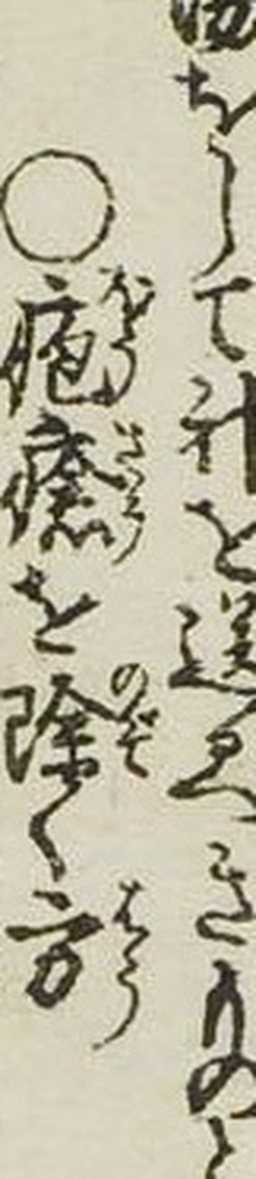〇疱瘡を除く方
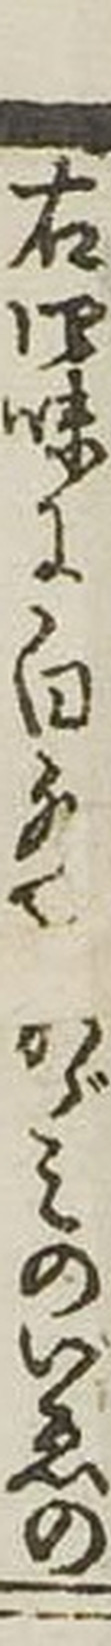右四味に白水かゞみのいゑの
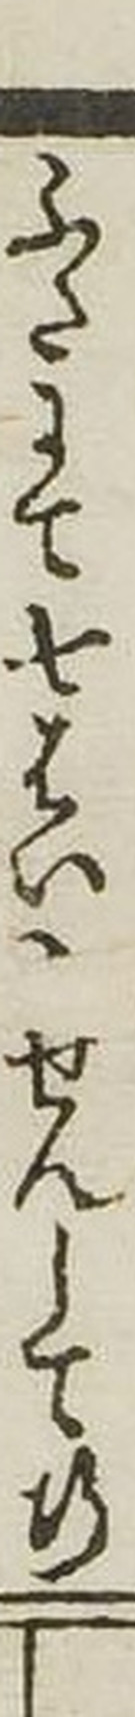ふたにて七はいせんして行
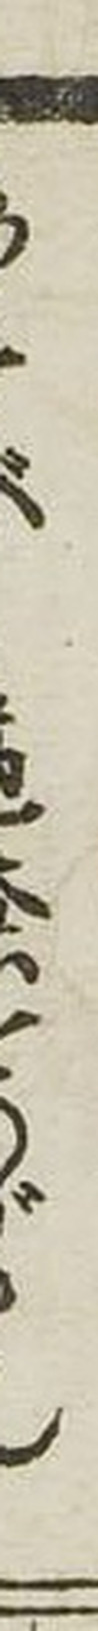水すべし疱瘡をのがるゝ也
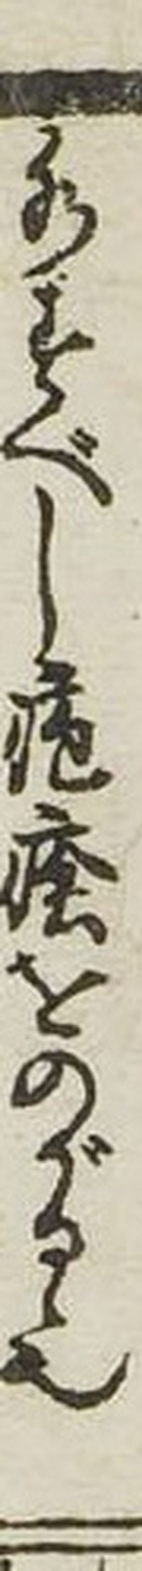水すべし疱瘡をのがるゝ也
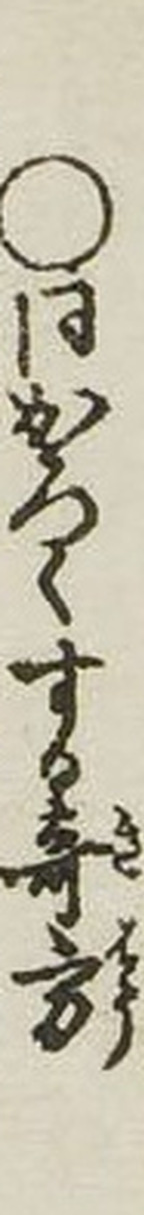〇同かろくする奇方
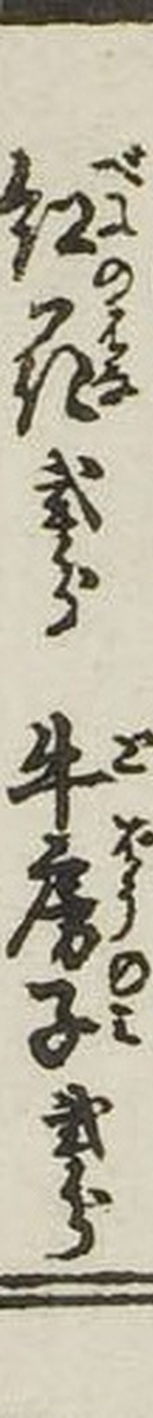紅花弐分牛房子弐分
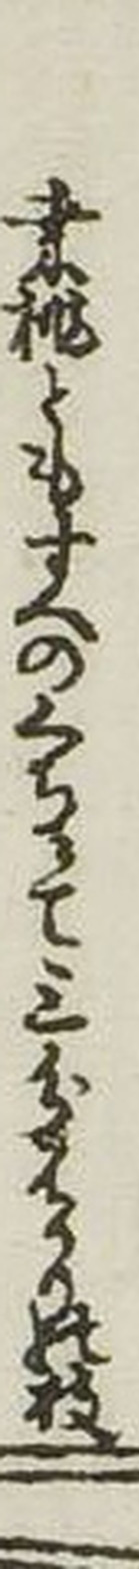桑桃ともすへのくちにて三分はかりの枝
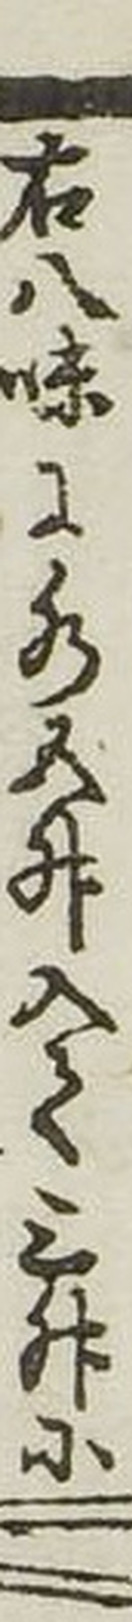右八味に水五升入て三升に
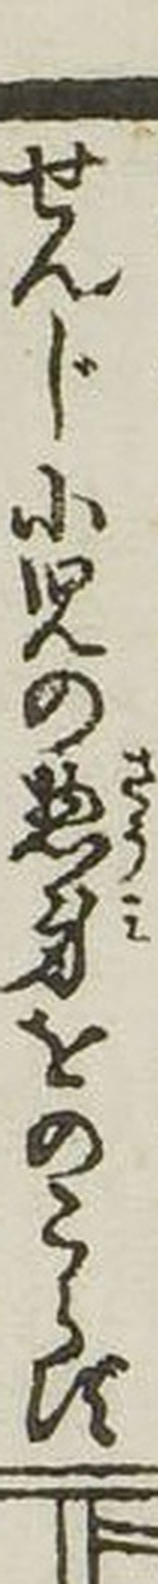せんじ小児の惣身をのこらず
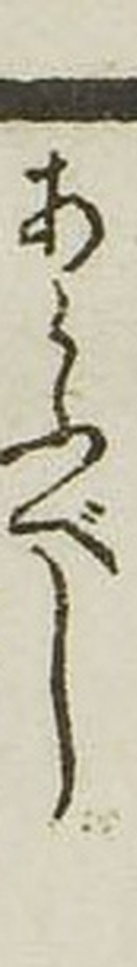あらふべし
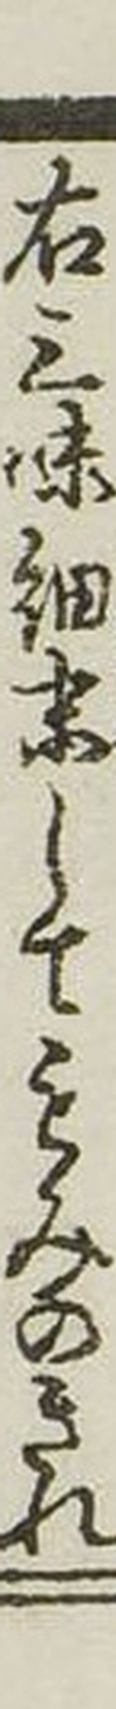右三味細末してもみのきれ
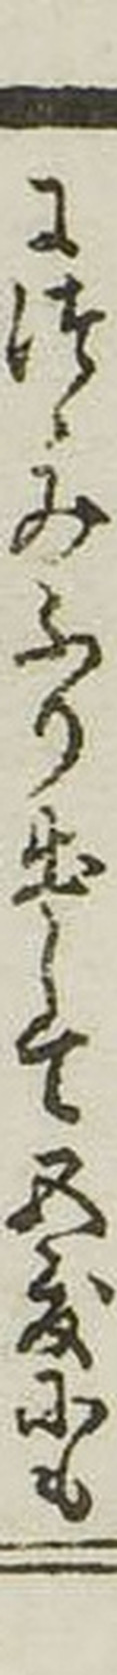につゝみふり出して五度にも
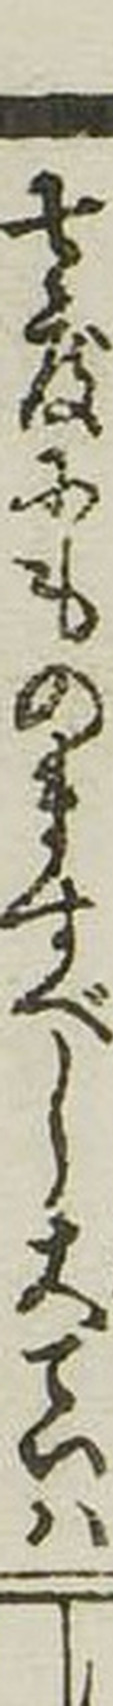七度にものますべし大ていは
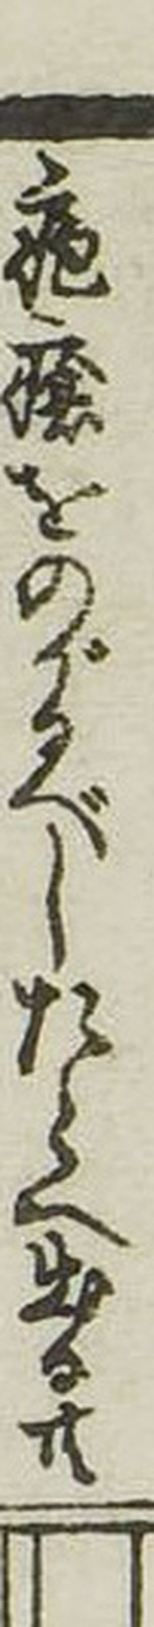疱瘡をのがるべしたとへ出る共
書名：商人書翰便覧
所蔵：東京学芸大学教育コンテンツアーカイブ
